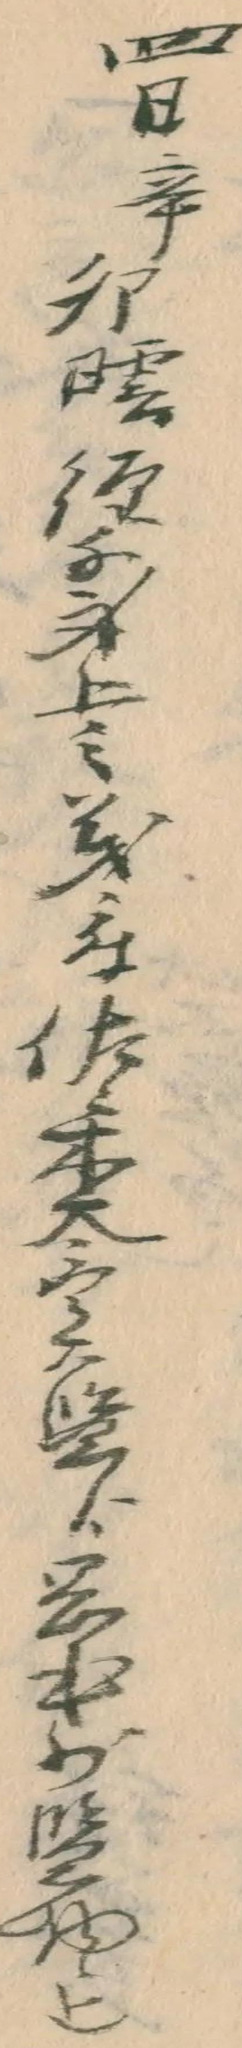四日辛卯曇経千身上之義二付佐々木太宰大監ゟ岡本少監物迄
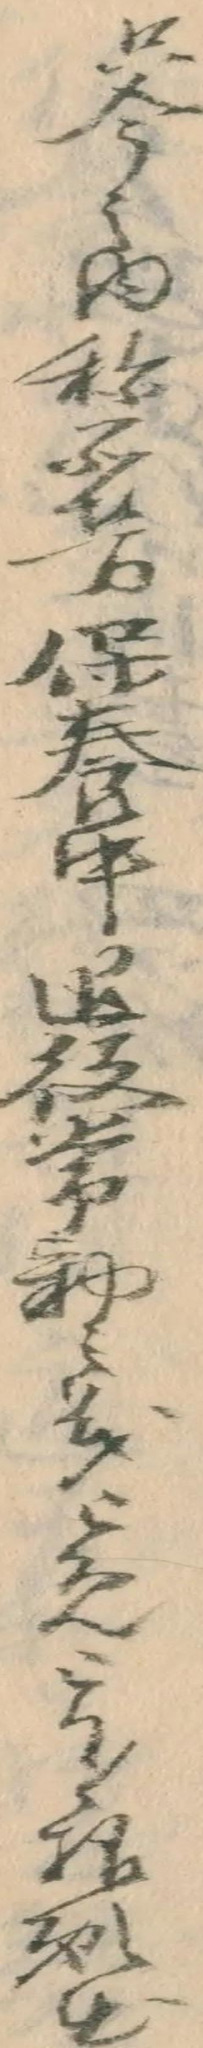只今之内称所労保養中退役常勤之義被免被下候様願出
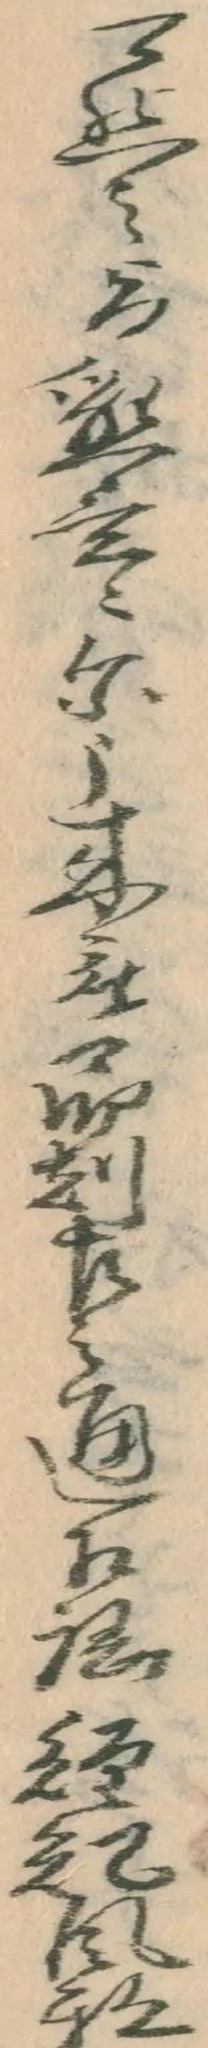可然之旨懇意ニ尓申来ニ付即刻左之通相認経紀経風邪

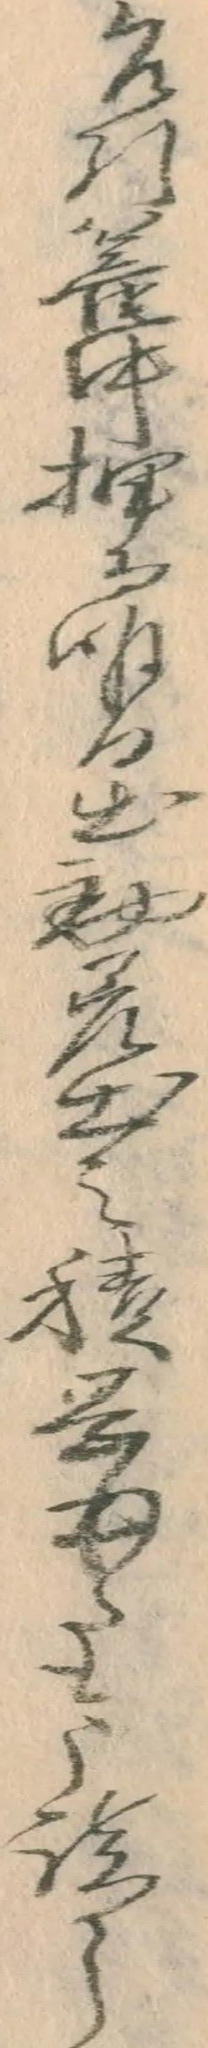乍引篭中押而明日出勤差出之積岡本へも申談了
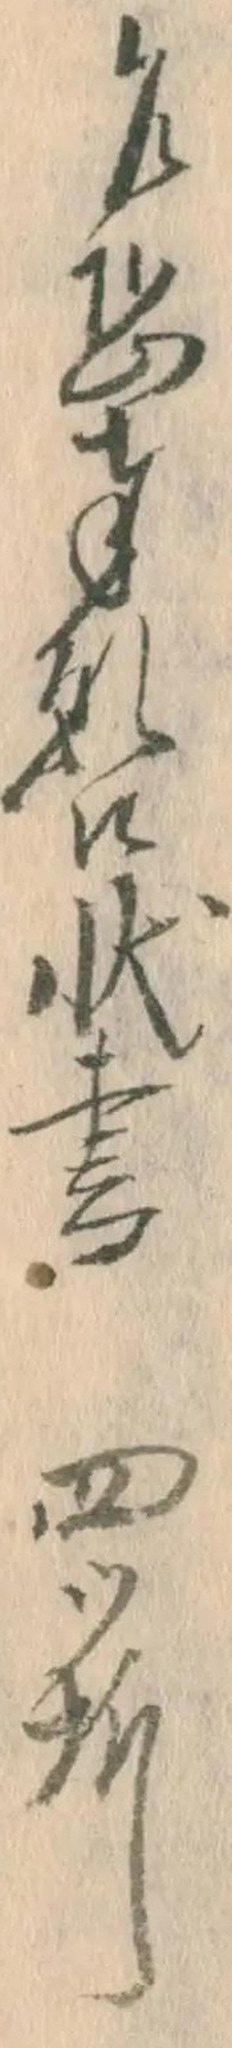乍恐奉願口状書四ツ折
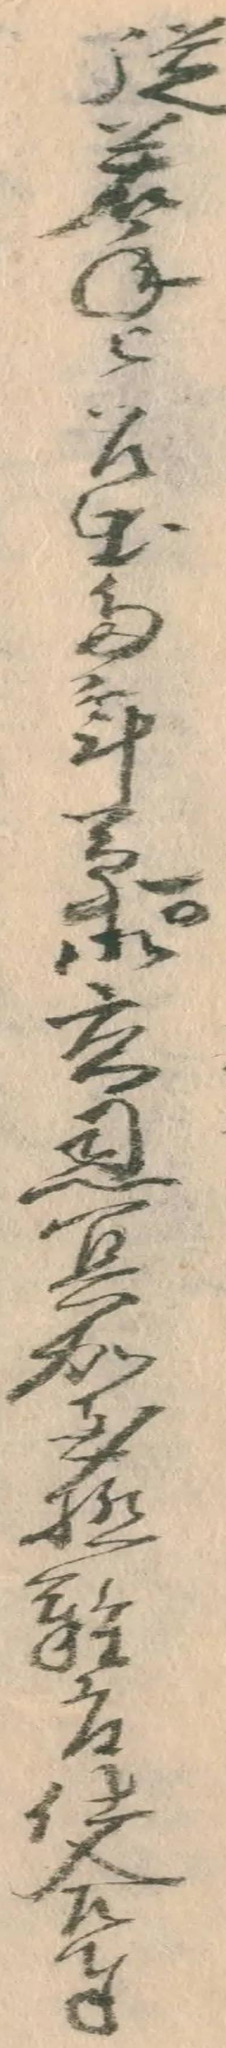従若年被召出多年蒙高恩冥加支極難有仕合奉
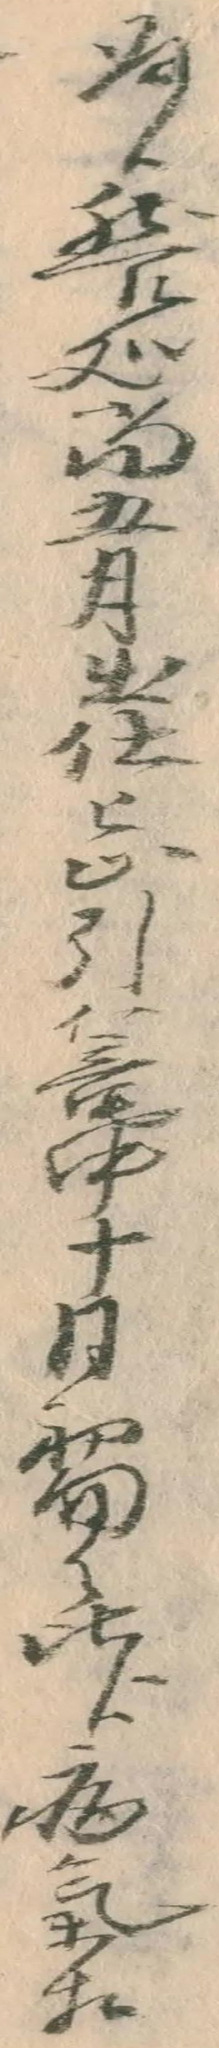存候然ル処當五月出仕被止引篭中十月初旬之比ゟ病氣相
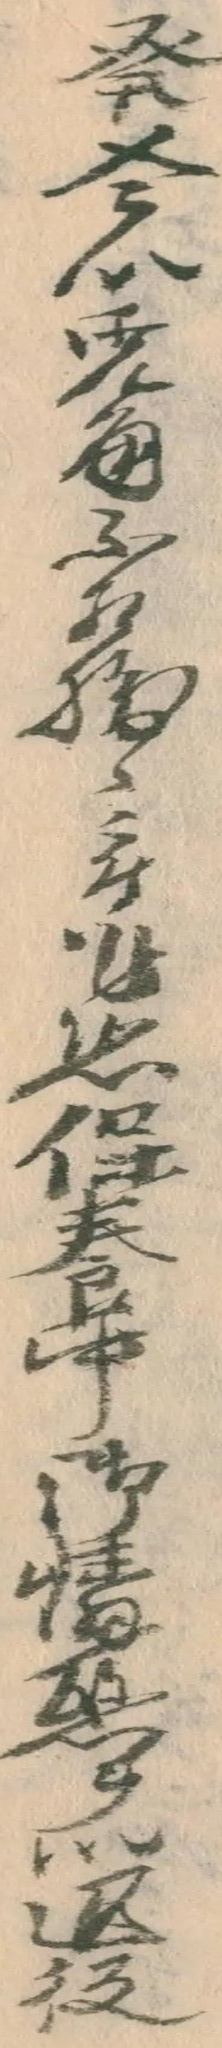発入候様兎角不相勝候ニ付乍恐保養中御憐愍ヲ以退役
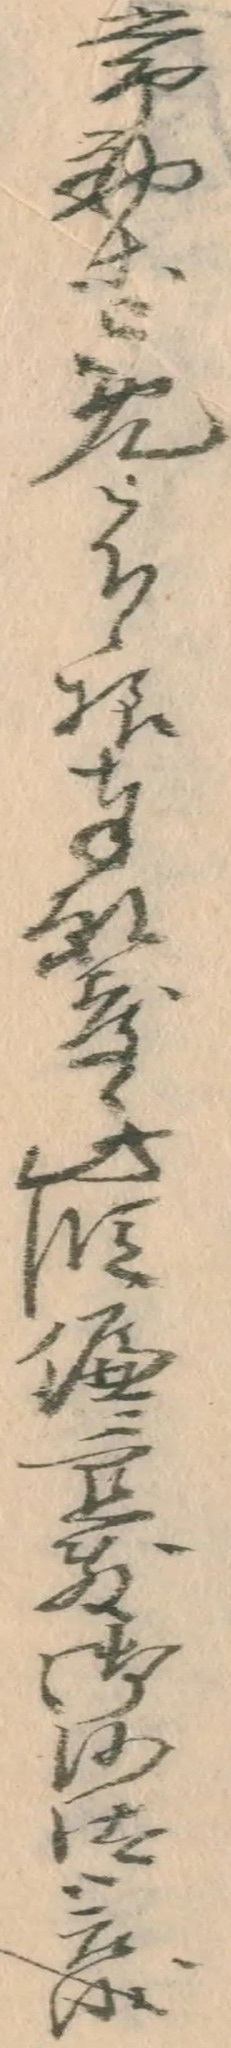常勤等被免被下候様奉願度候此段偏ニ宜敷御沙汰御取成
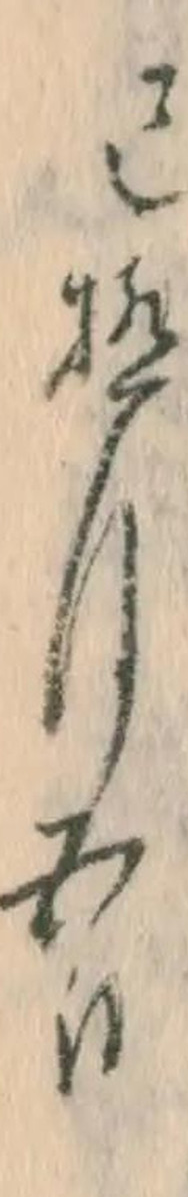己極月五日
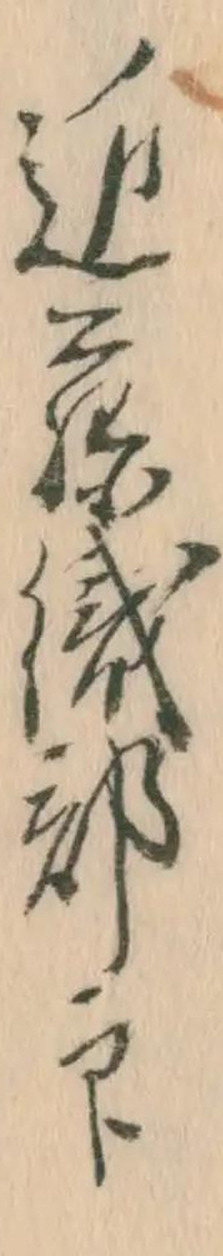近藤織部印
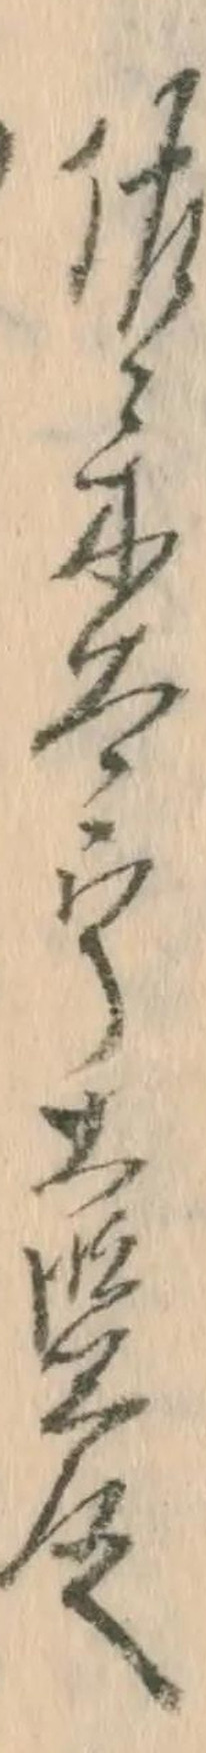佐々木太宰大監殿
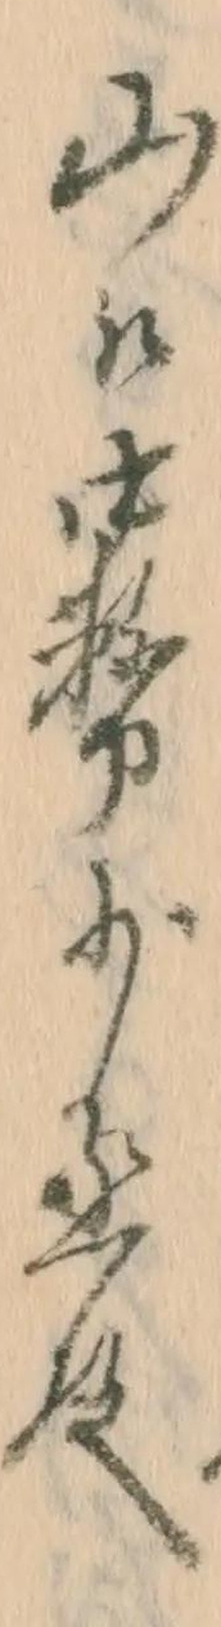山口中務少丞殿
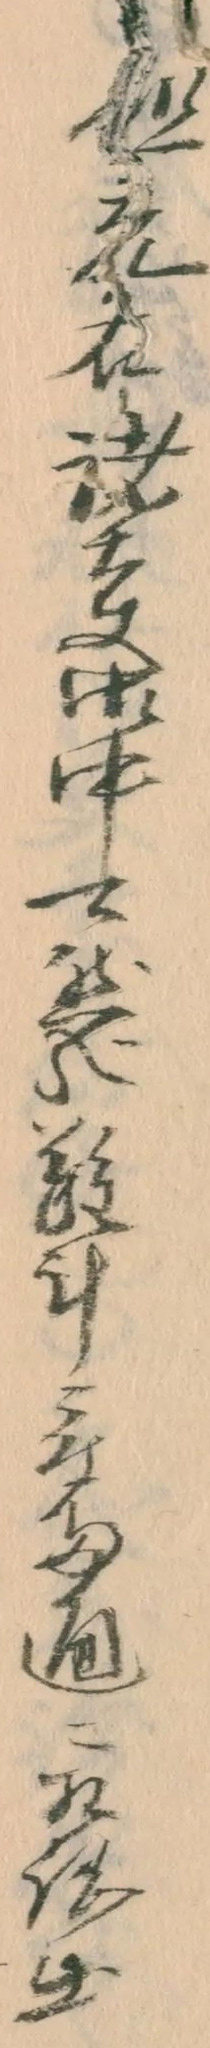但充名諸大夫御中可然哉難斗ニ付両通に相認出
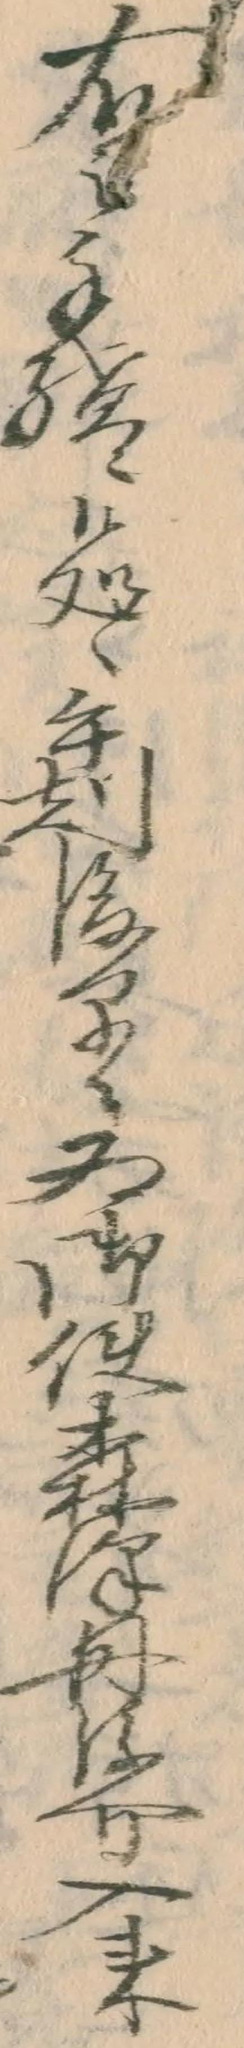右之手續ニ候処へ午刻後早々為御使森澤丹後介入来
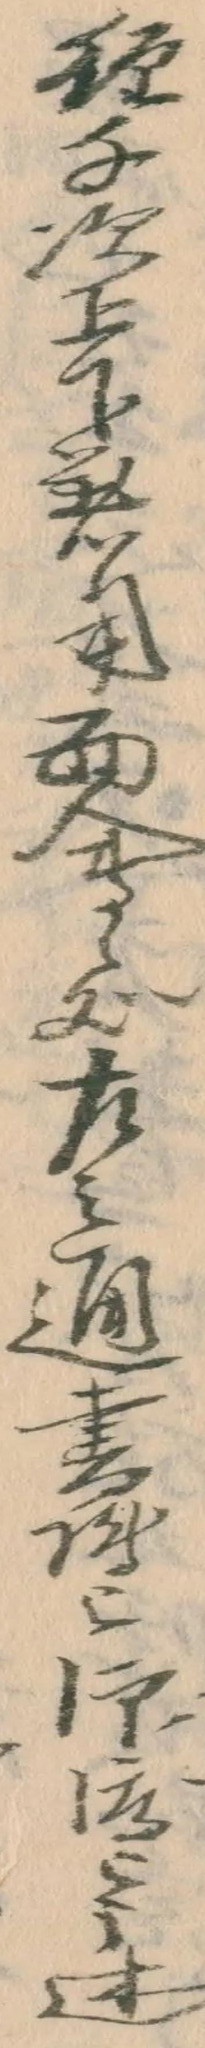経千次上下着用面會之処左之通書附被仰渡被申述
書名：賀茂社記録. 第70冊
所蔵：国立国会図書館 National Diet Library, JAPAN
